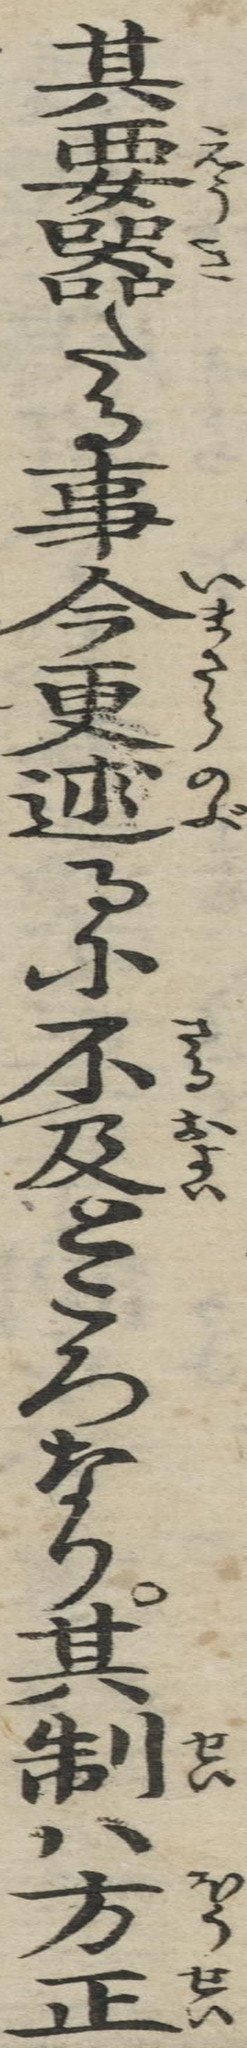其要器たる事今更述るに不及ところなり。其制は方正
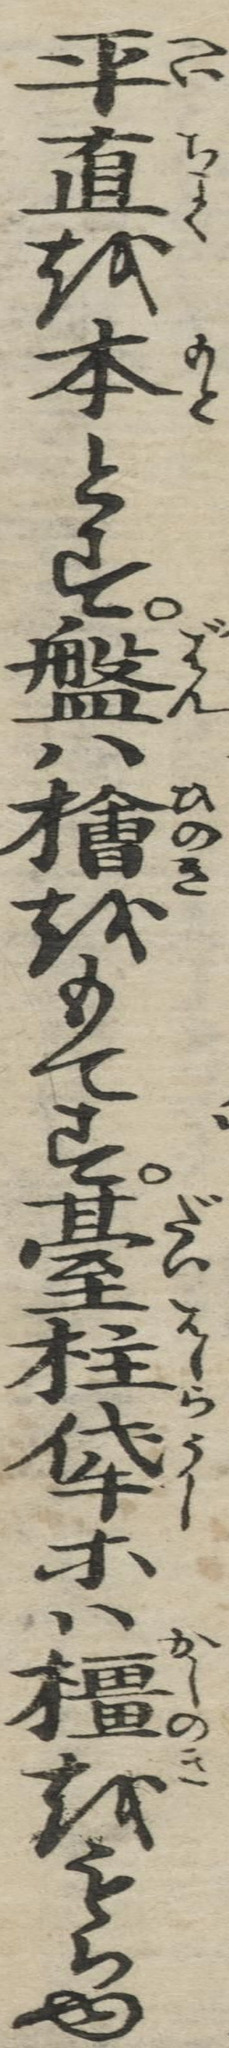平直を本とす。盤は桧をもてす。台柱牮等は橿をもちゆ
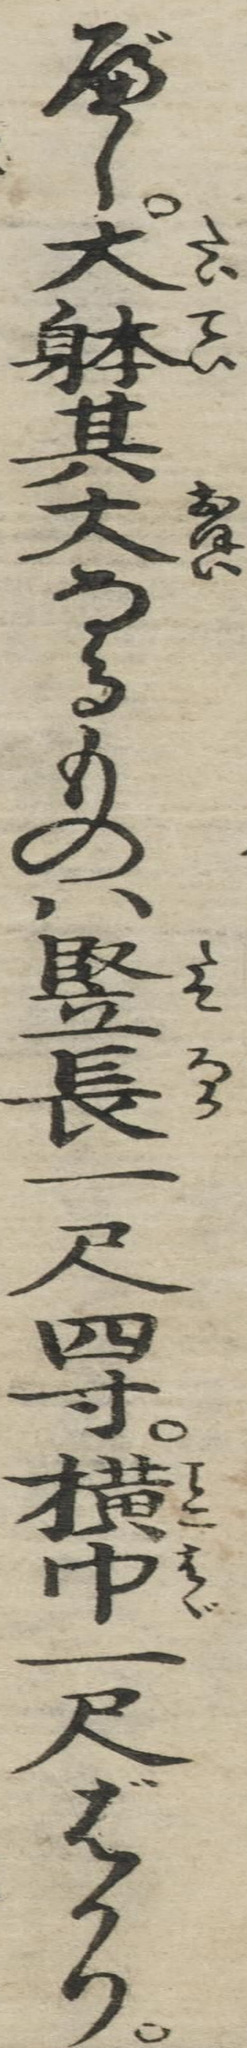べし。大躰其大なるものは堅長一尺四寸。横巾一尺ばかり。
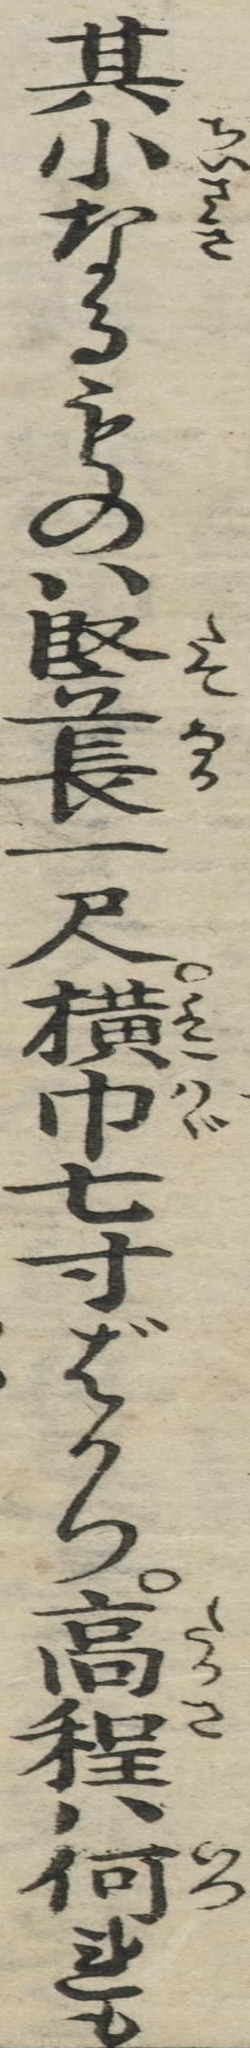其小なるものは堅長一尺。横巾七寸ばかり。高程は何れも
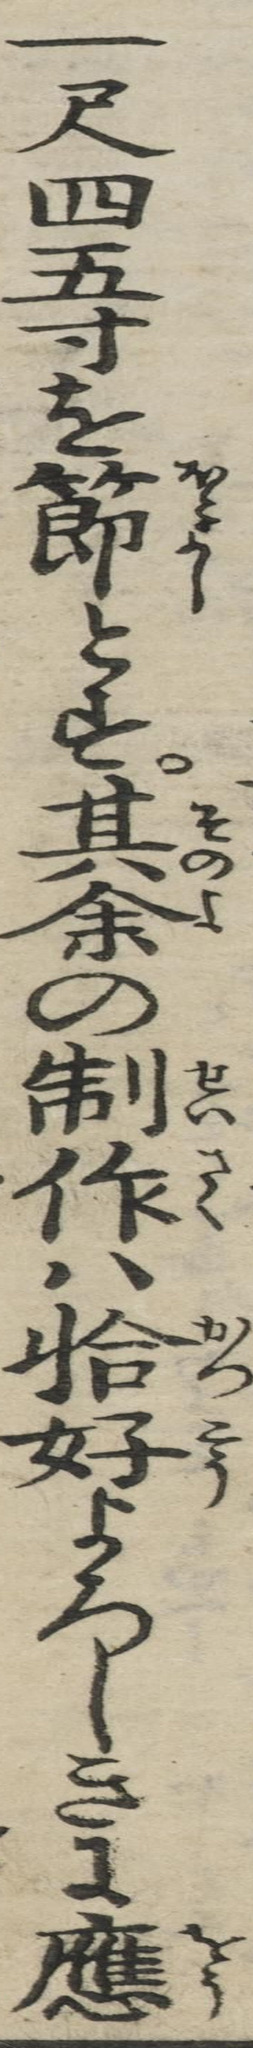一尺四五寸を節とす。其余の制作は恰好よろしきに応
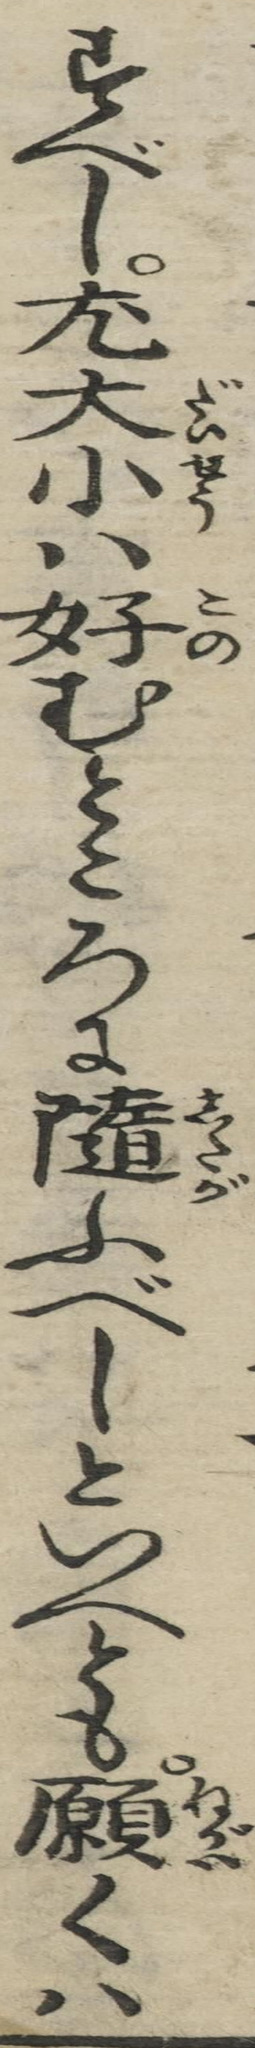すべし。尤大小は好むところに随ふべしといへとも。願くは

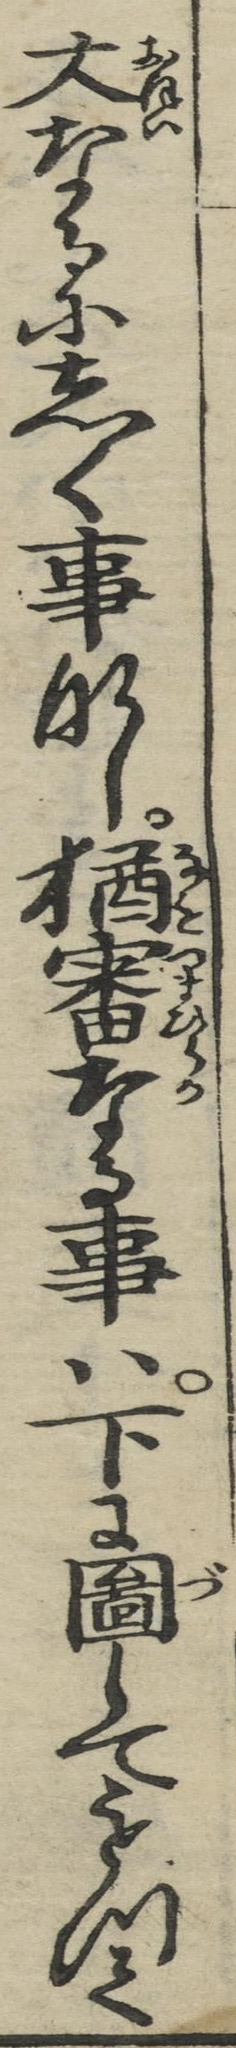大なるにしく事なし。猶審なる事は。下に図してもつて
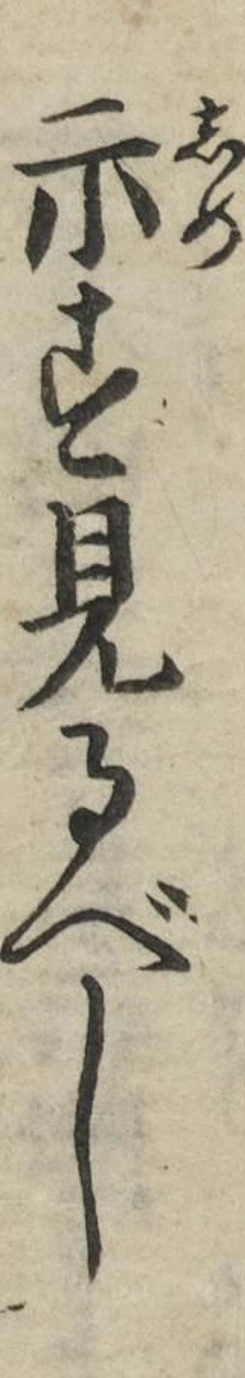示す見るべし
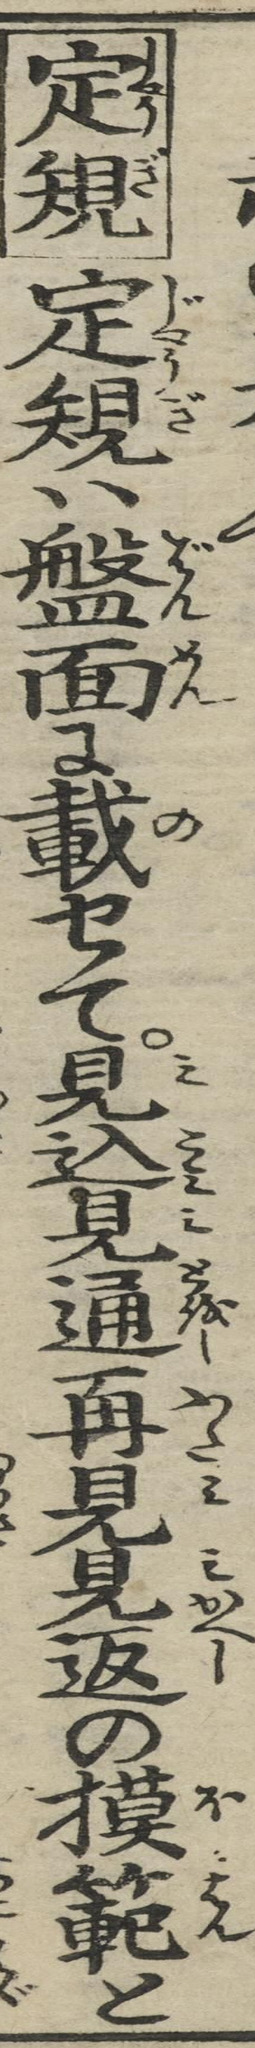定規定規は盤面に載せて。見込見通再見見返の模範と
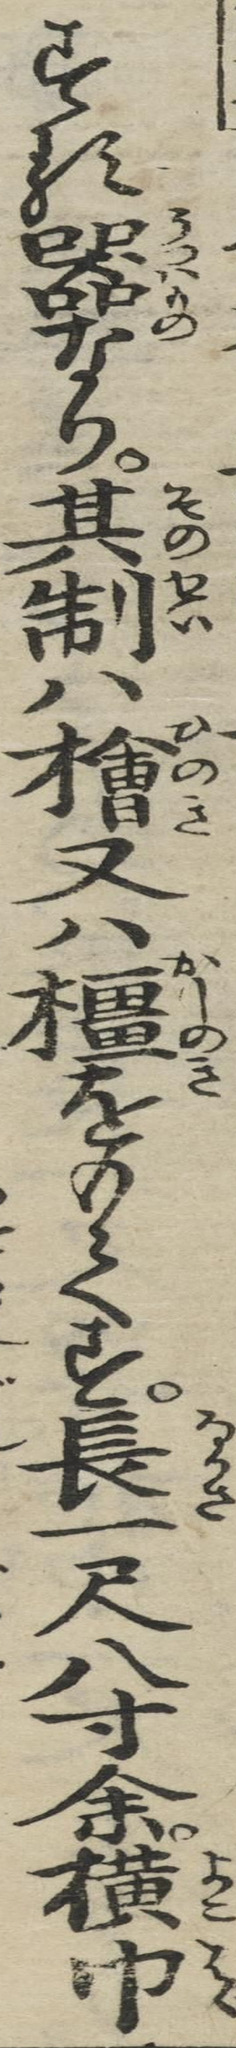する器なり。其制は桧又は橿をもてす。長一尺八寸余。横巾
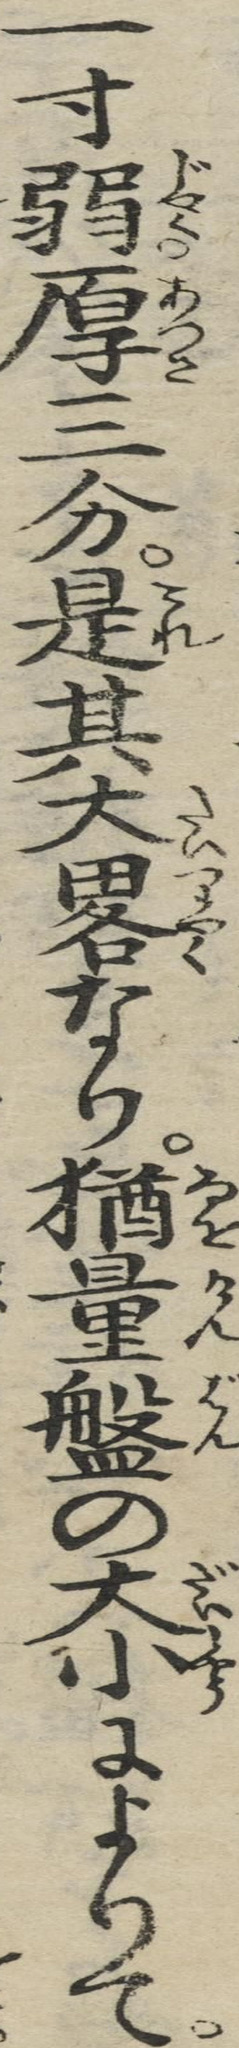一寸弱。厚三分。是其大略なり。猶量盤の大小によりて。
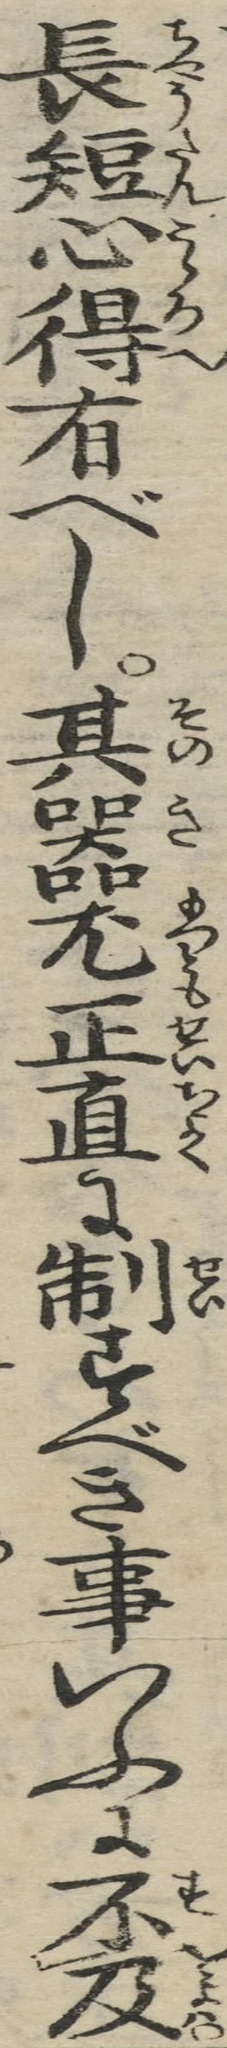長短心得有べし。其器尤正直に制すべき事いふに不及。
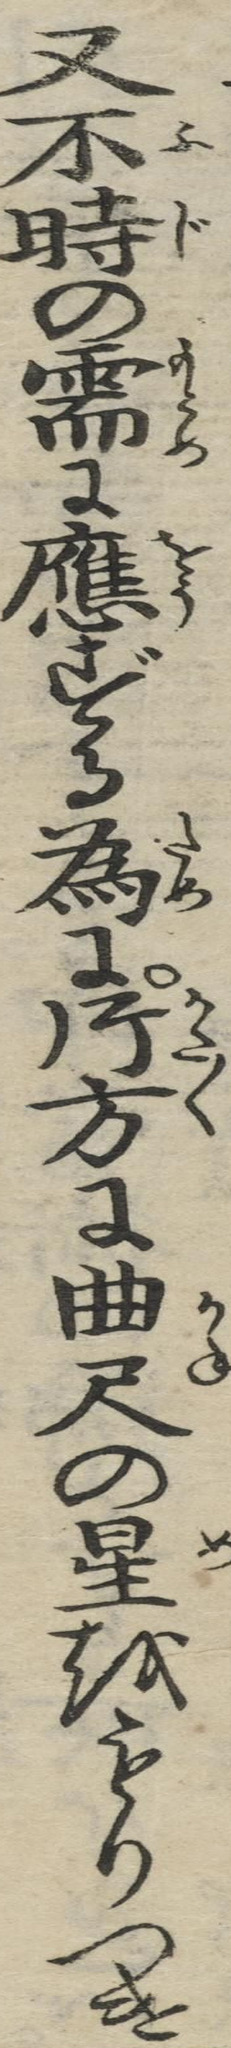又不時の需に応ずる為に。片方に曲尺の星をもりつれ
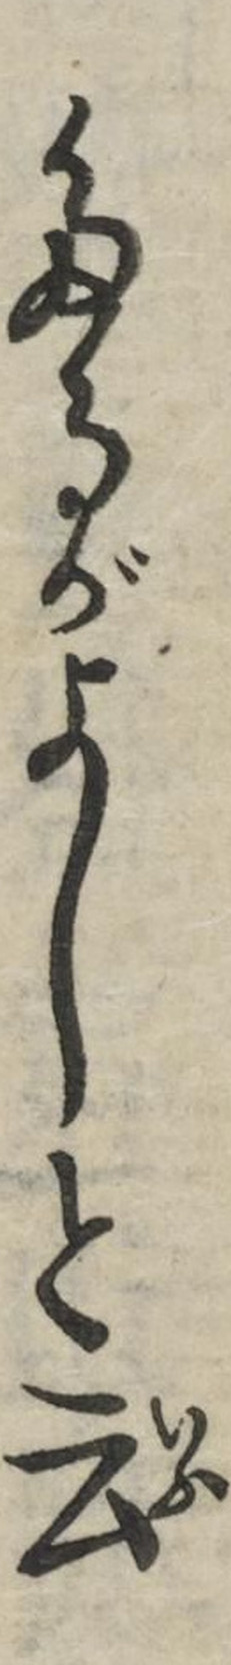たるがよしと云
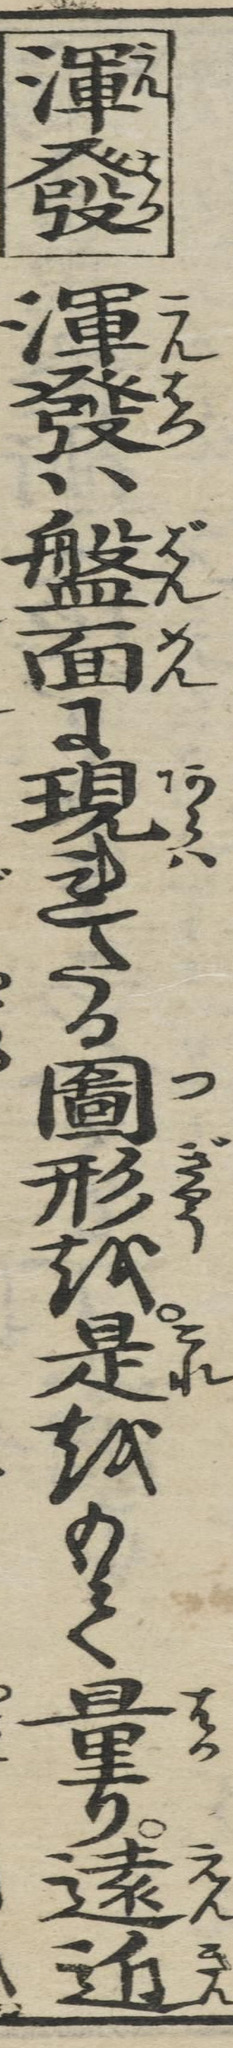渾発渾発は盤面に現れたる図形を。是をもて量り。遠近
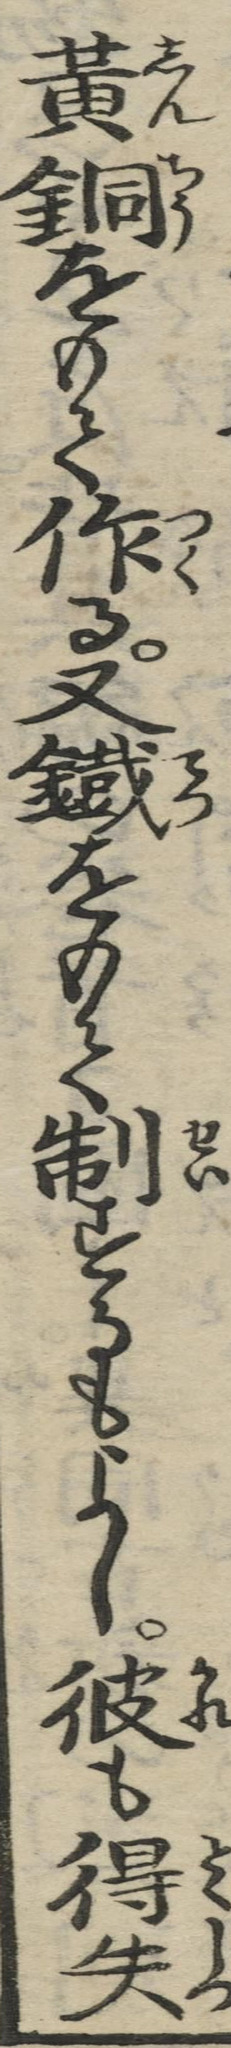黄銅をもて作る。又鉄をもて制するもよし。彼も得失
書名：量地指南　巻之一（内題）
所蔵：東京大学地震研究所図書室 Earthquake Research Institute Library, The University of Tokyo, JAPAN
